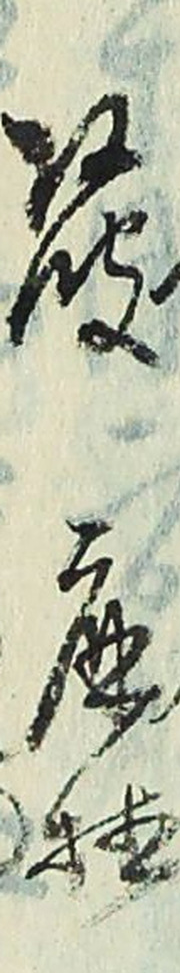阿波麻植
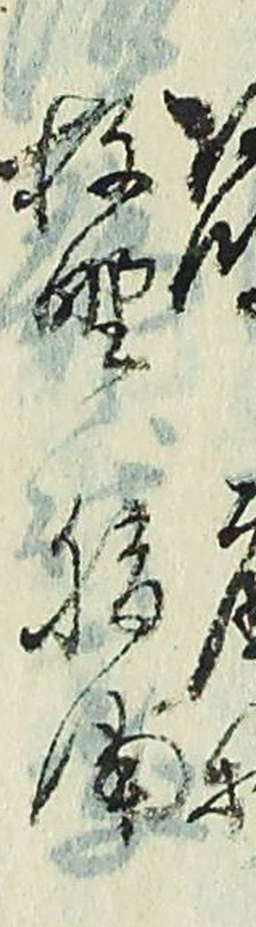板野勝浦
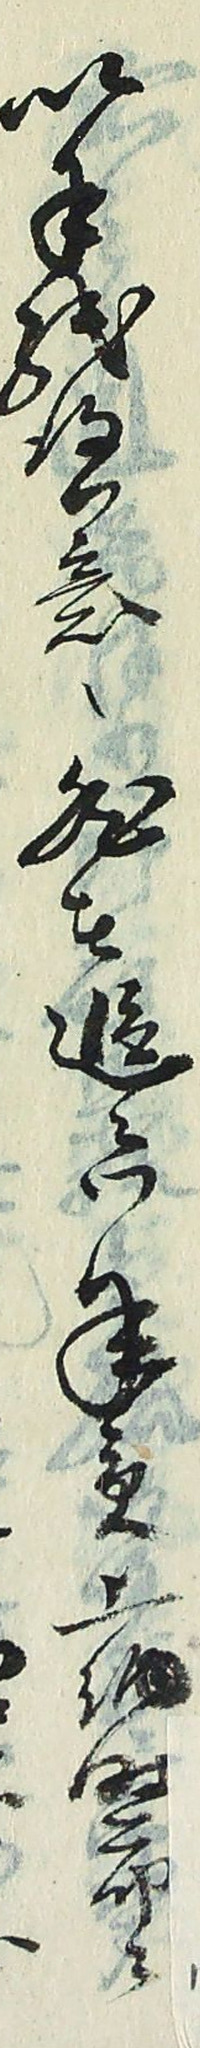以手紙得御意候然者追々御年貢上納時節ニ
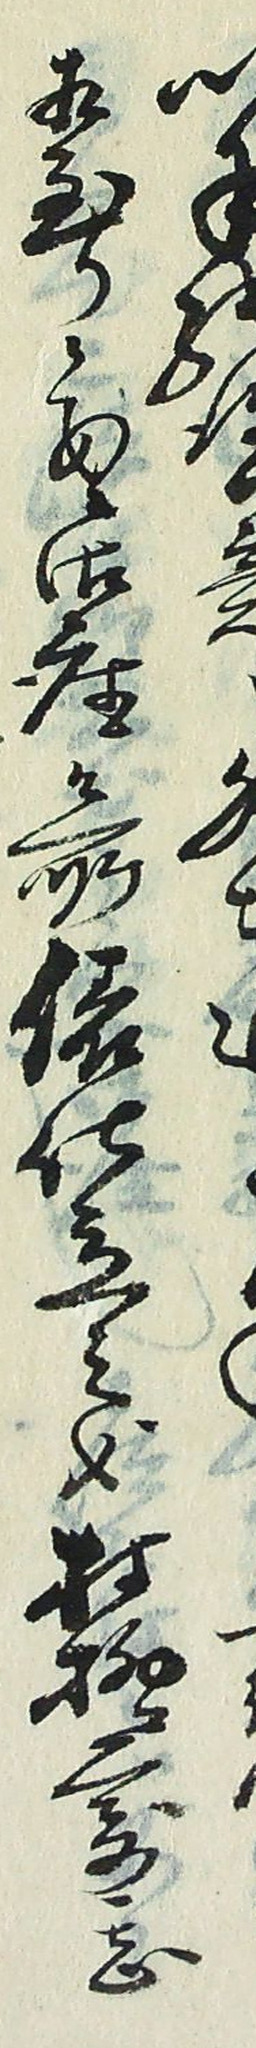相至り候義ニ御座候所俵仕立之義村柄ニ寄甚
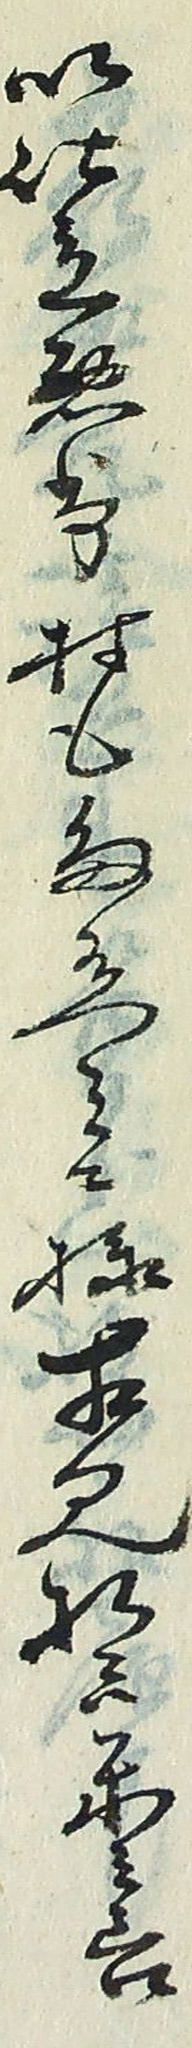以仕立悪布村も多有之候様相見折ニハ米之善
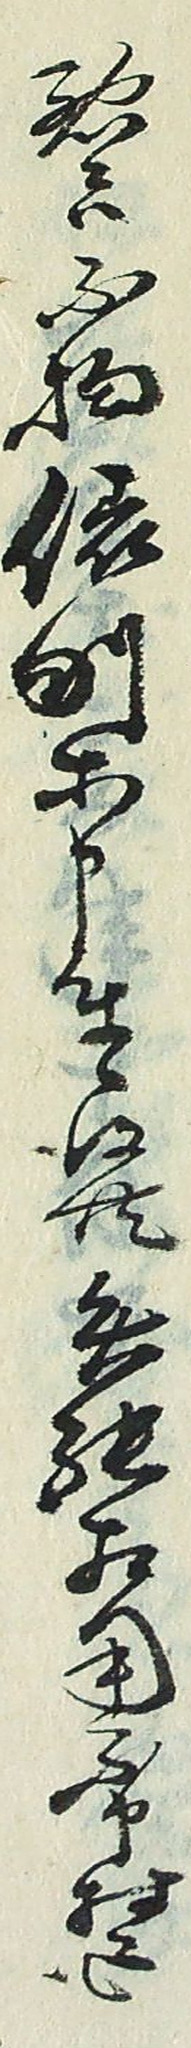悪ニハ不拘俵刎等申付候得共矢張相用不申村々も
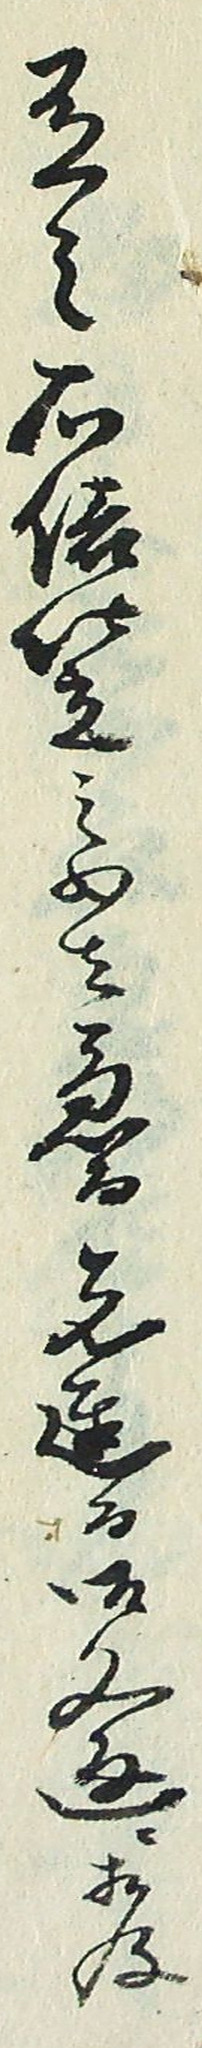有之右俵仕立之義者兼而先達而御文通ニ相及
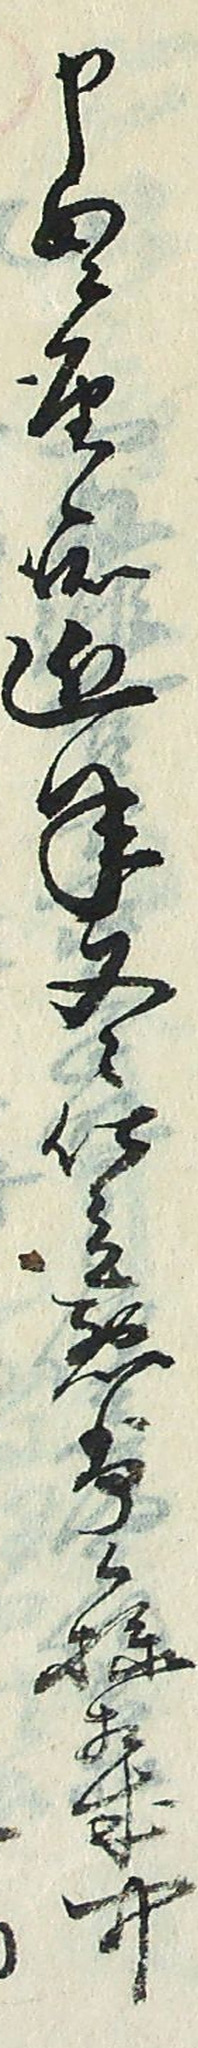申義ニ御坐候所近年又々仕立悪布候様相成中
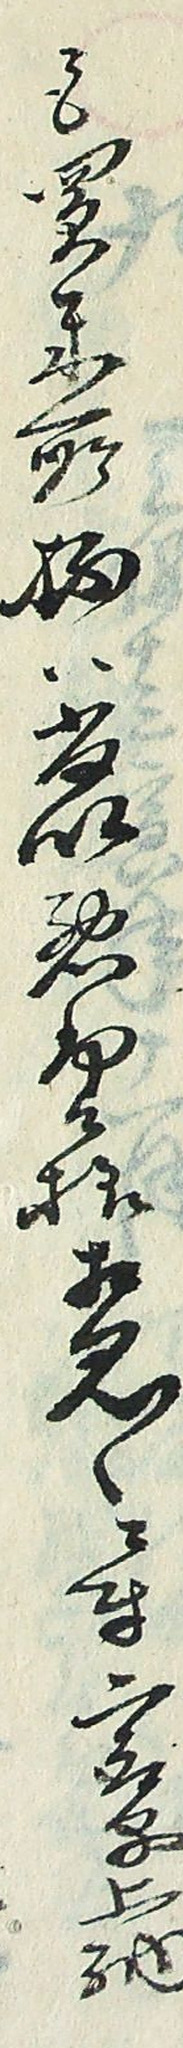ニも買米所抔ハ尚以悪布候様相見候ニ付最早上納
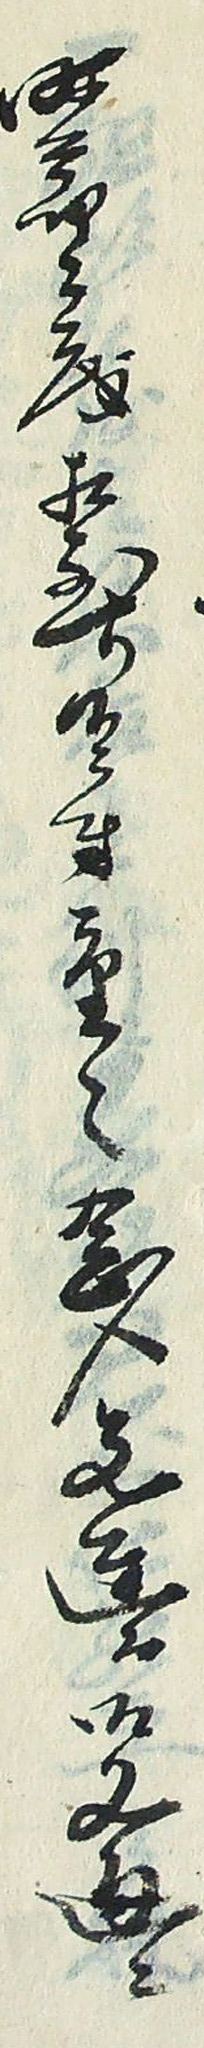時節ニも相至り候ニ付重々念入先達而御文通ニ

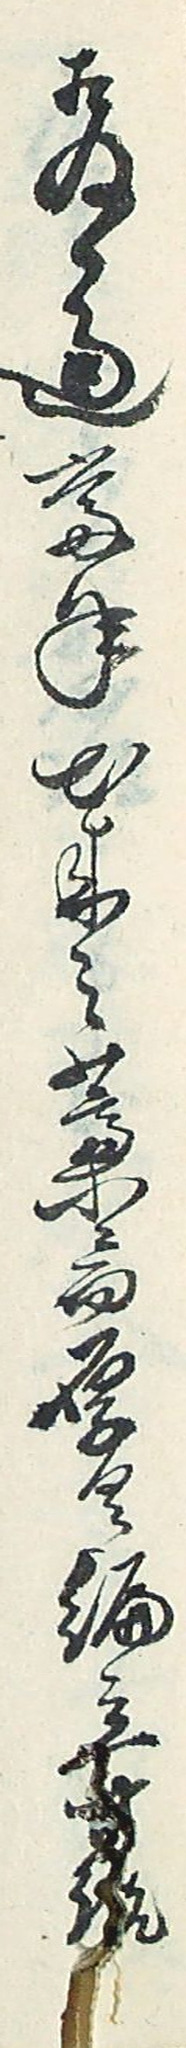相及候通當年出来之藁ニ而厚く編立中詰
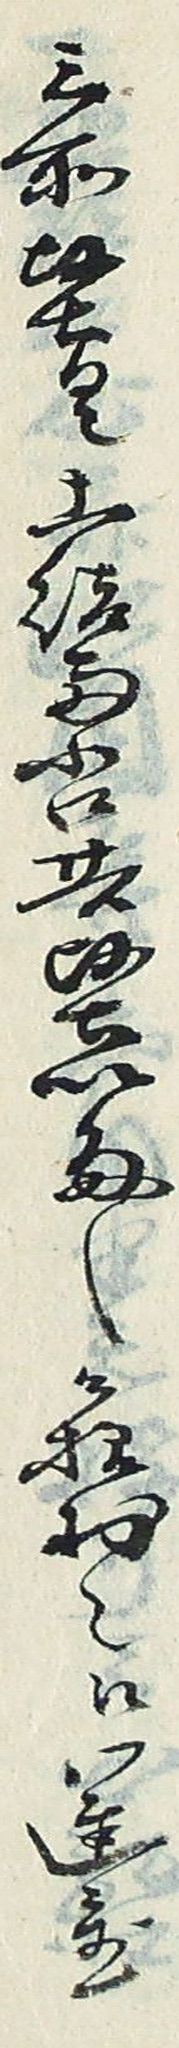三所堅く上詰両小口共堅いたし候様村々江御達置
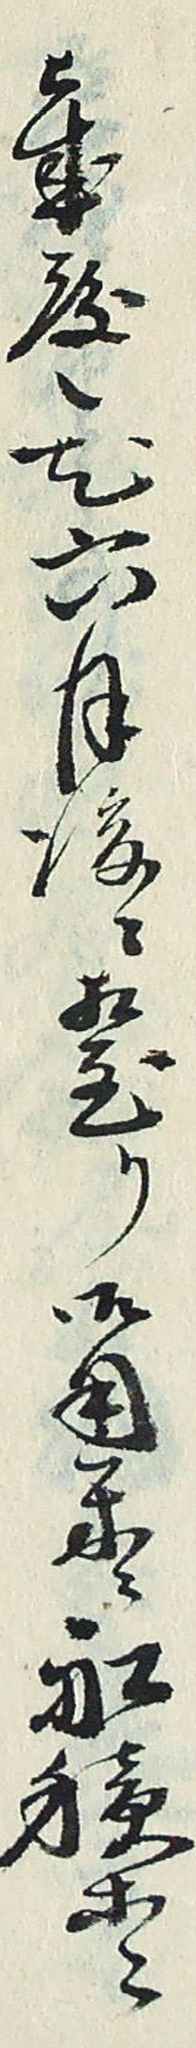被成度候尤六月後ニ相至り御用米ニ船積等ニ
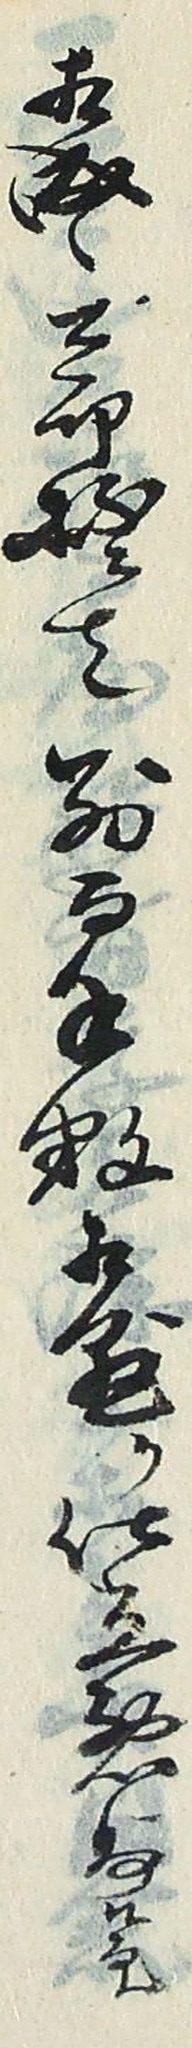相成候節抔ニ者別而手数相懸り仕立悪布候而ハ
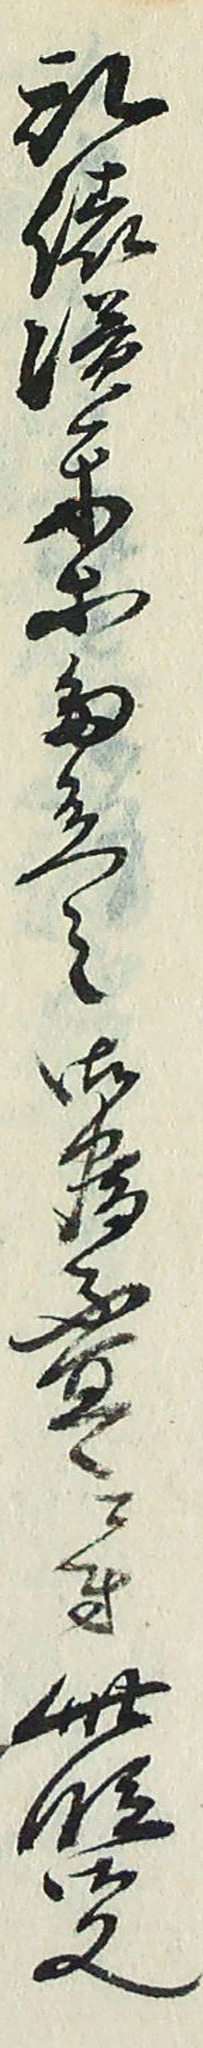乱俵潰米等多有之御為不宜候ニ付此段御文
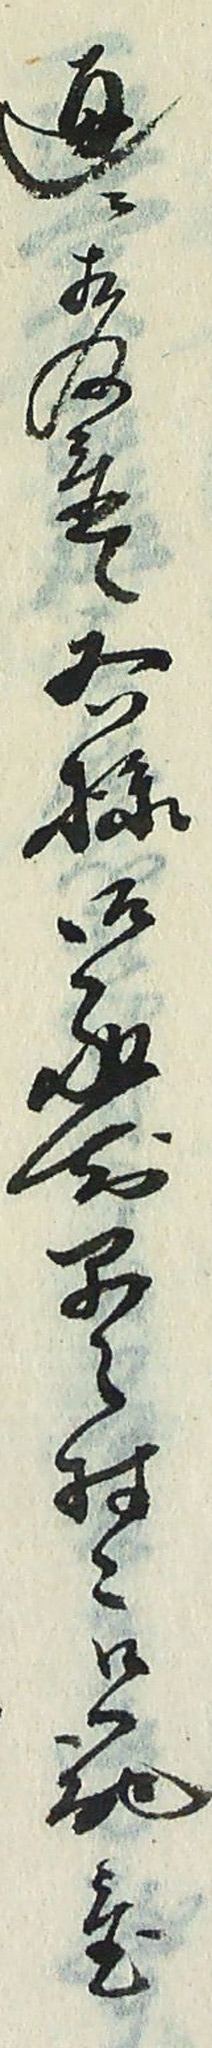通ニ相及置候右様御承知早々村々江御配置
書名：諸御趣意書并御下知向之写
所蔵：鳴門教育大学 Naruto University of Education
